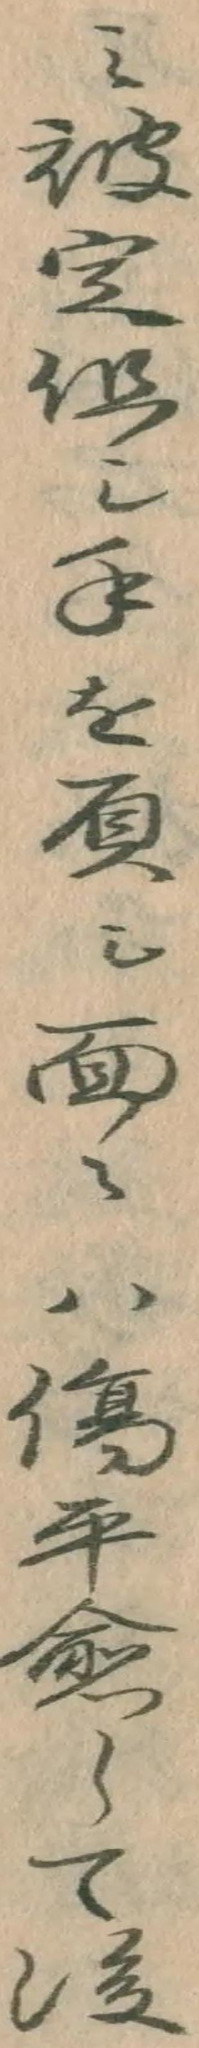之彼定但し手を負し面々は傷平愈して後
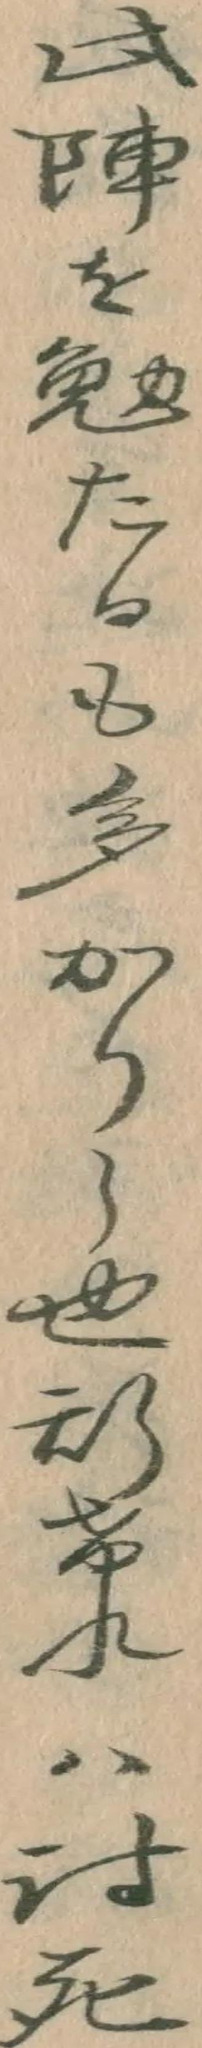此陣を勉たるも多かりし也斯希れは討死
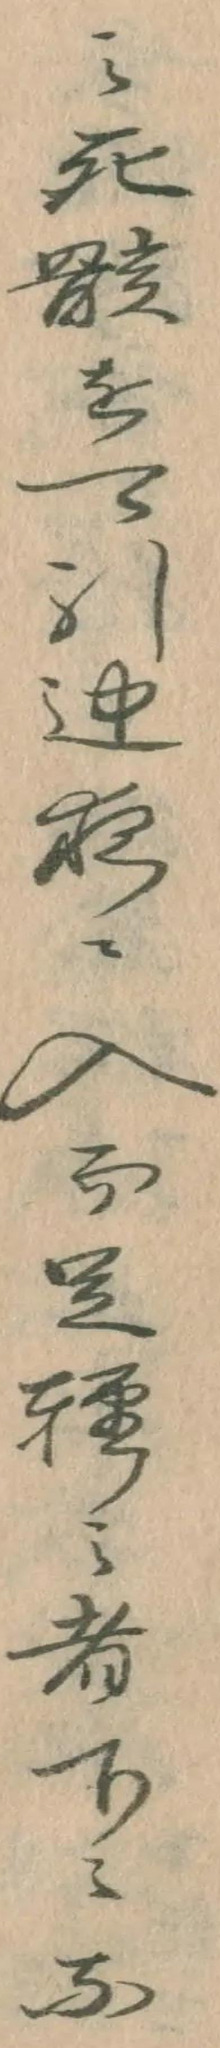之死骸を可引迚夜に入而足軽之者下々な
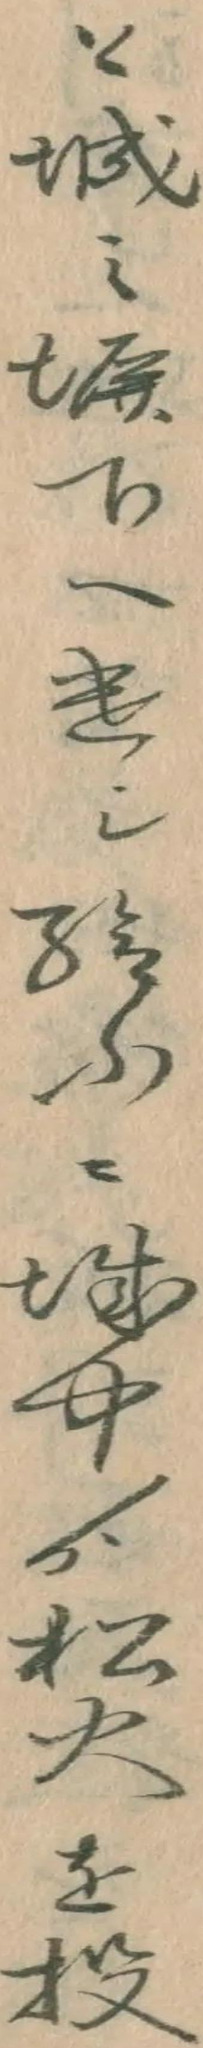と城之塀下へ遣し給ふに城中ゟ松火を投
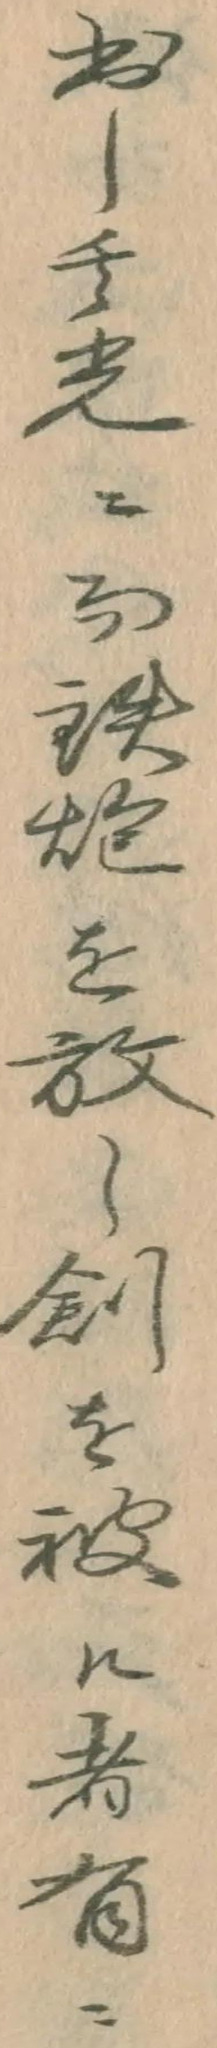出し其光に而鉄炮を放し創を被る者有に

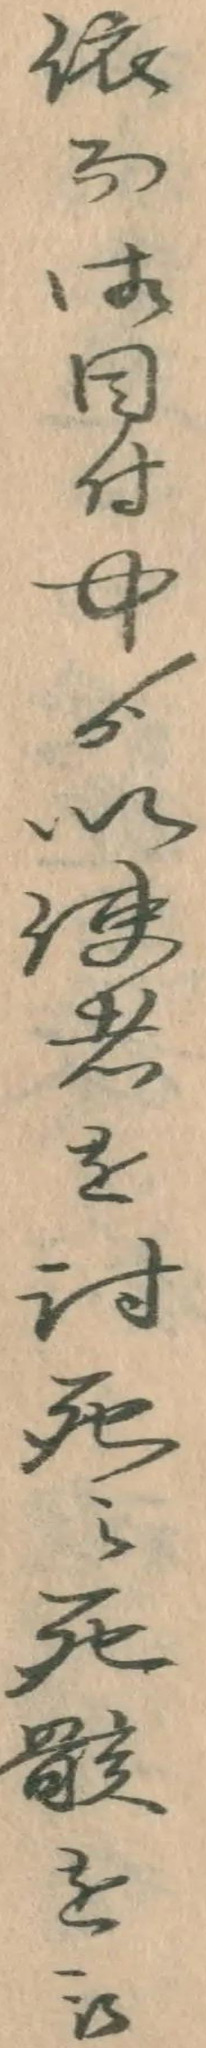依而御目付中ゟ以使者を討死之死骸を被
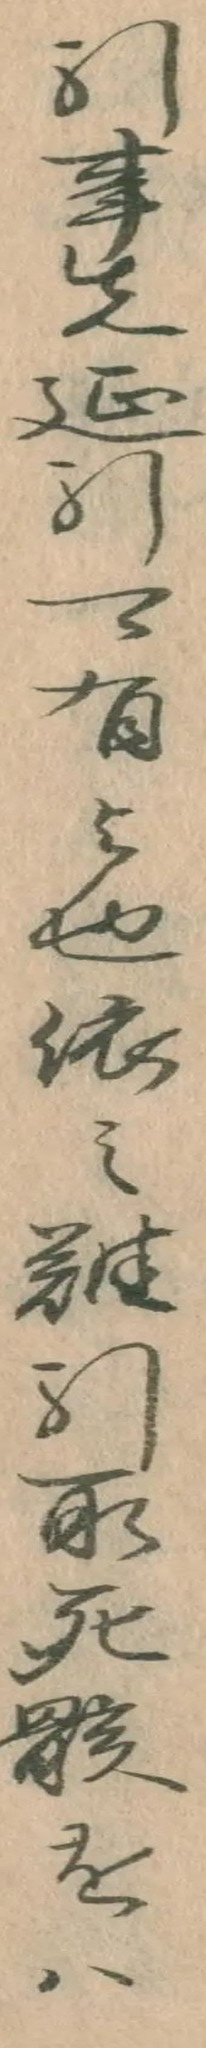引事先延引可有与也依之難引取死骸をは
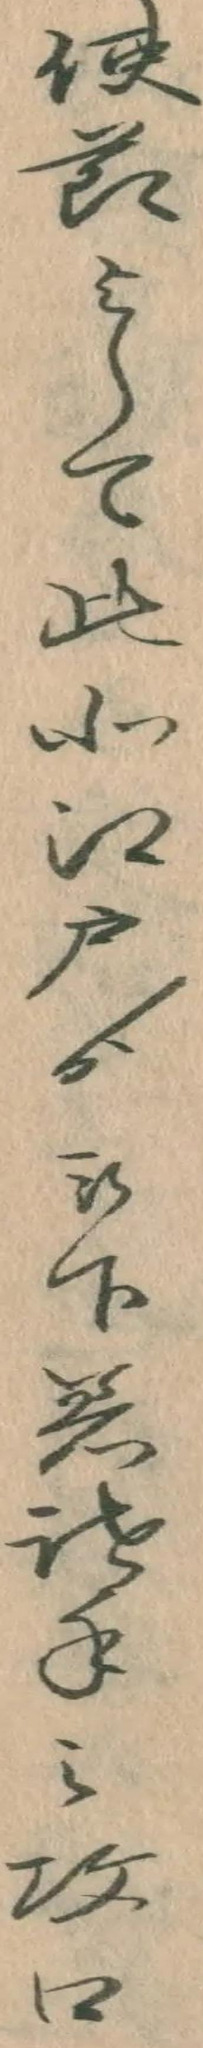使節与して此北江戸ゟ被下着諸手之攻口
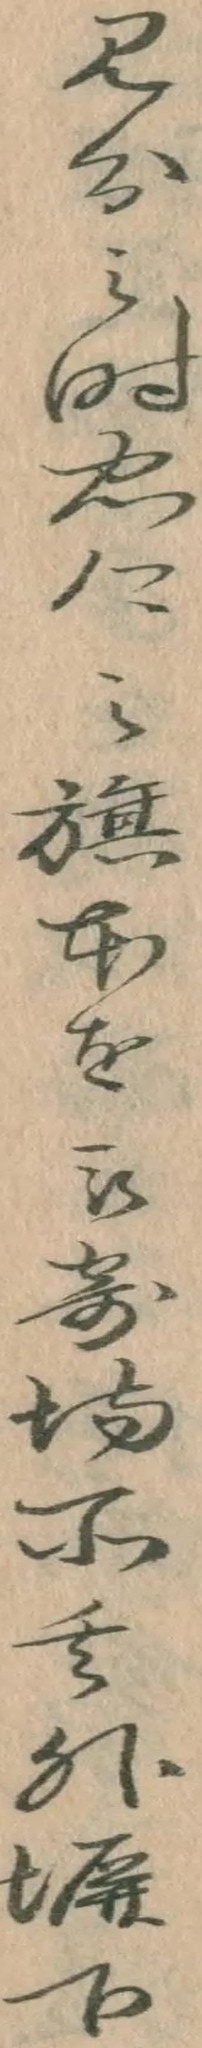見分之時忠郷之旗本を被寄場所其外塀下
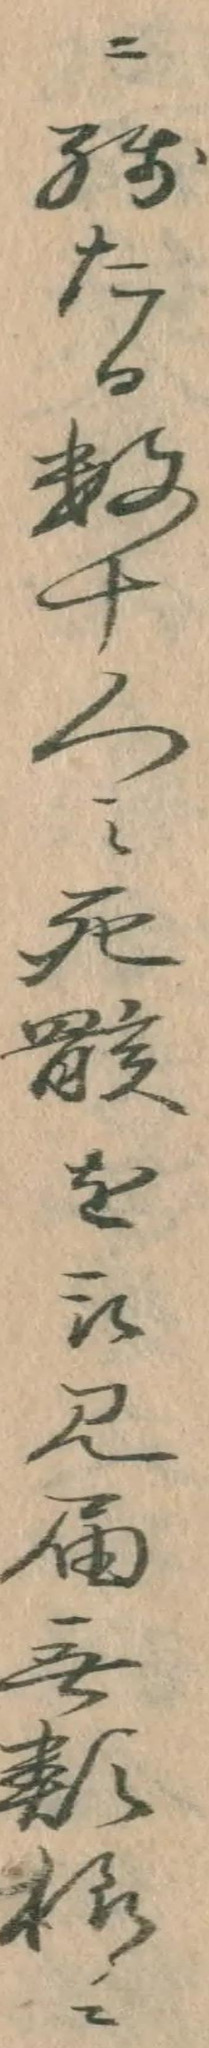に残たる数十人之死骸を被見届無類様に
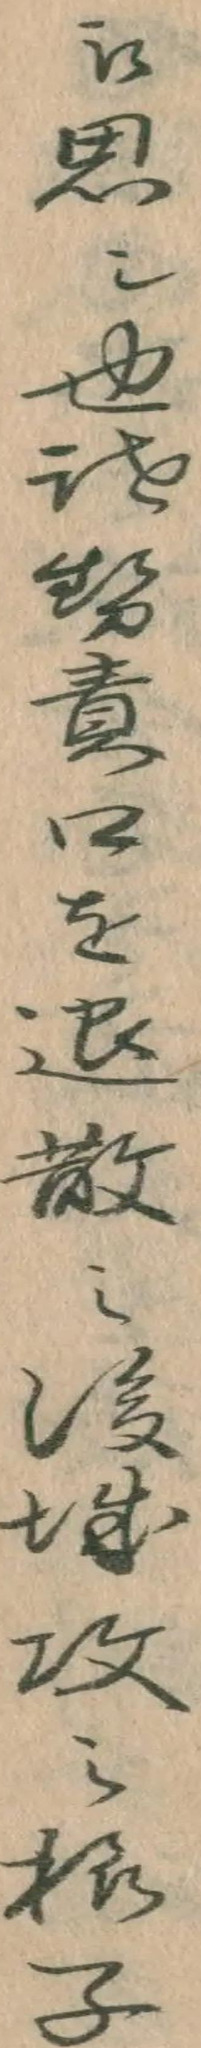被思し也諸勢責口を退散之後城攻之様子
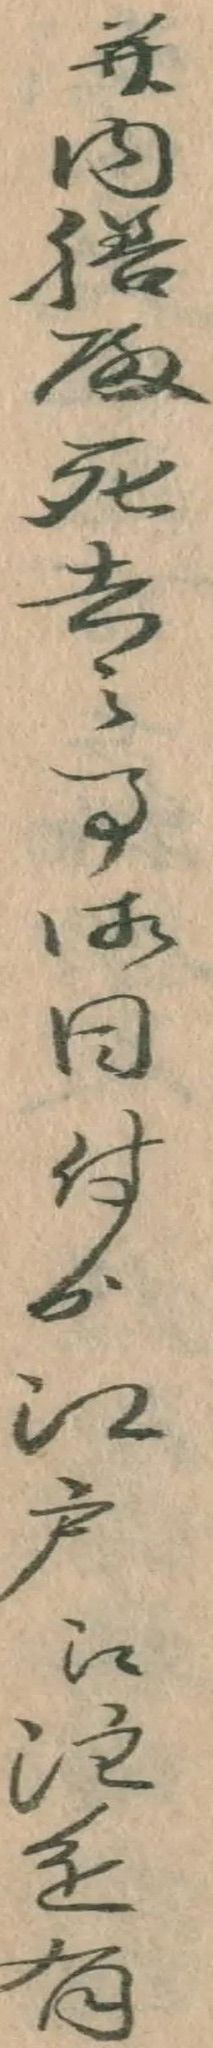幷内膳殿死去之事御目付ゟ江戸江注進有
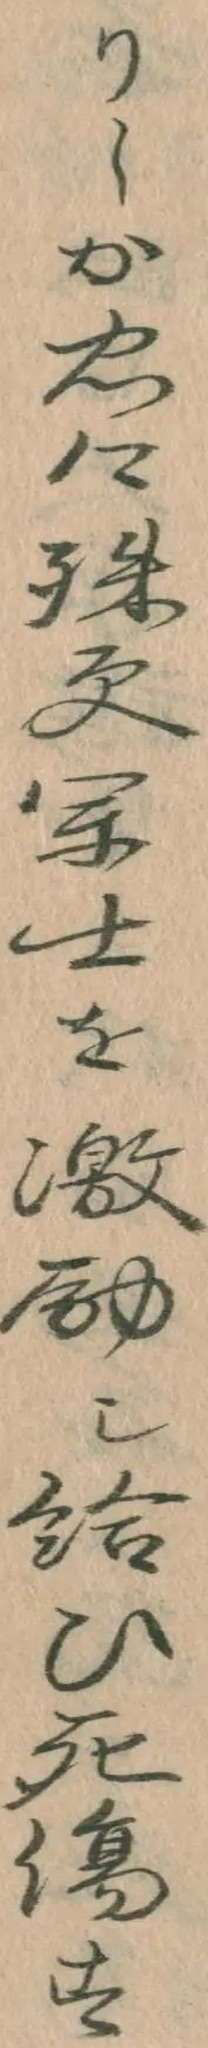りしか忠郷事更軍士を激励し給ひ死傷春
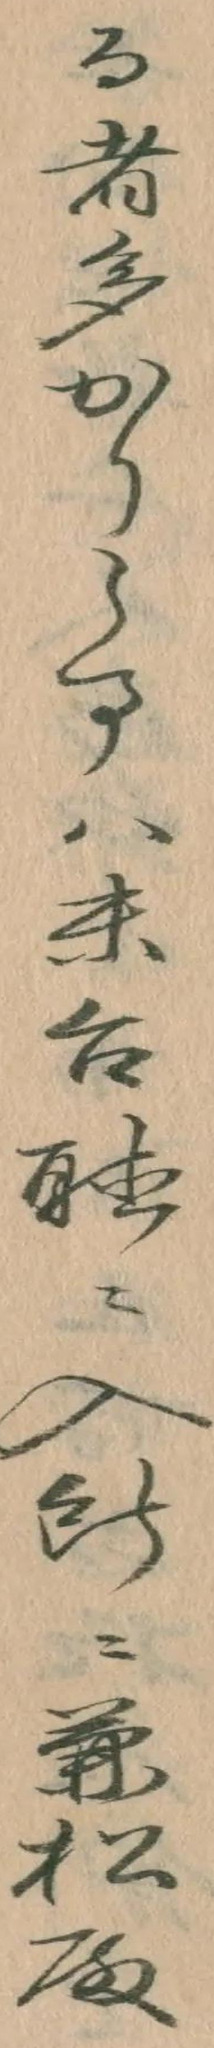る者多かりし事は未召聴に入所に兼松殿
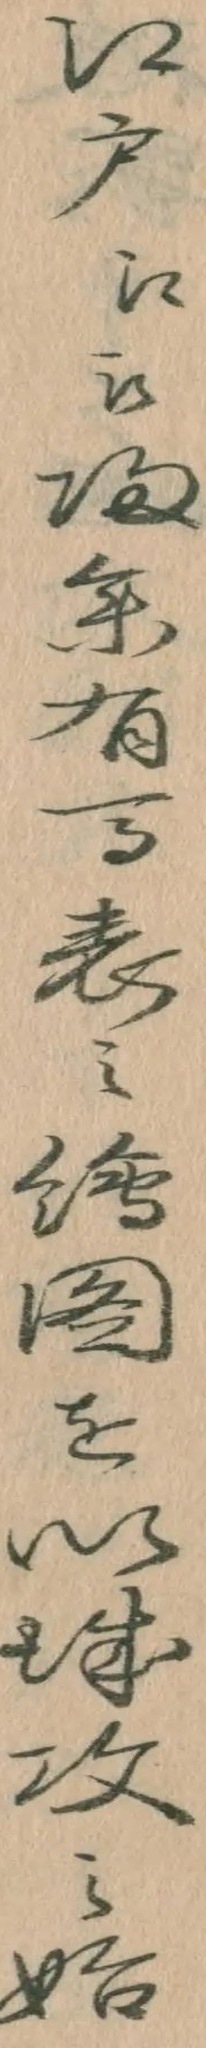江戸江被帰参有馬表之絵図を以城攻之始
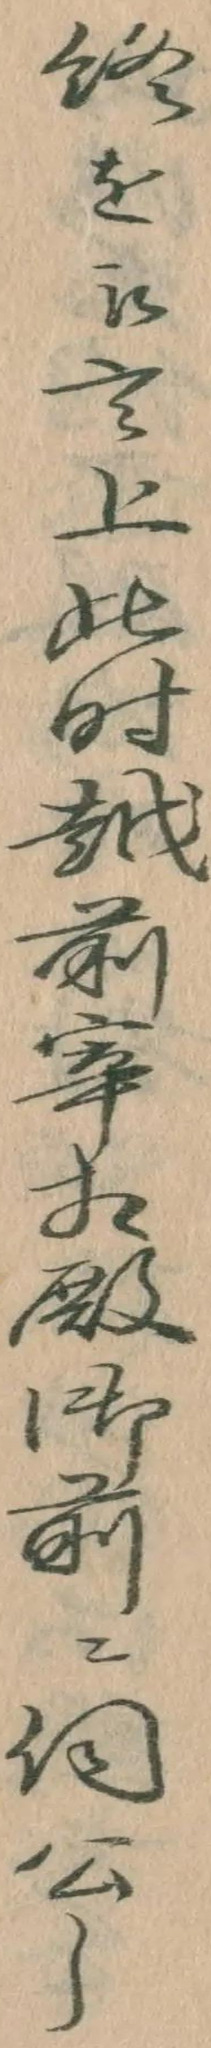終を被言上此時越前宰相殿御前に伺公し
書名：切支丹御退治記 49巻. [5]
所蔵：国立国会図書館 National Diet Library, JAPAN
